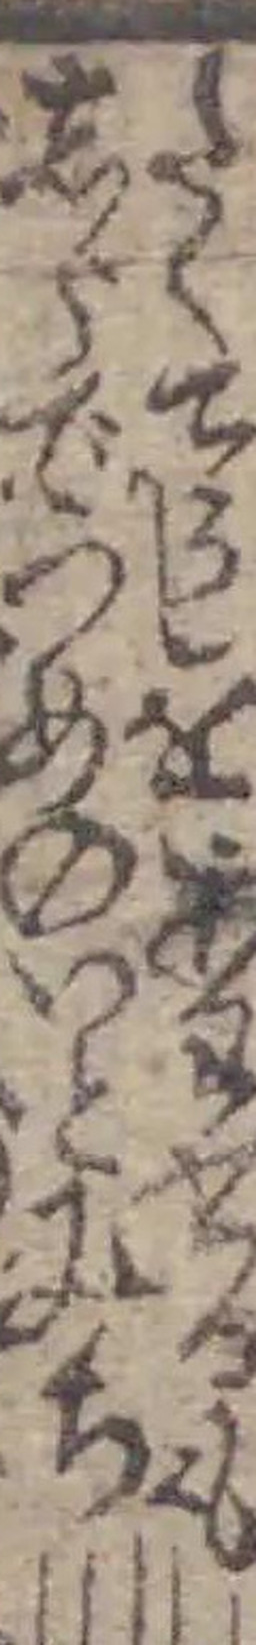しらでつめのいとみち
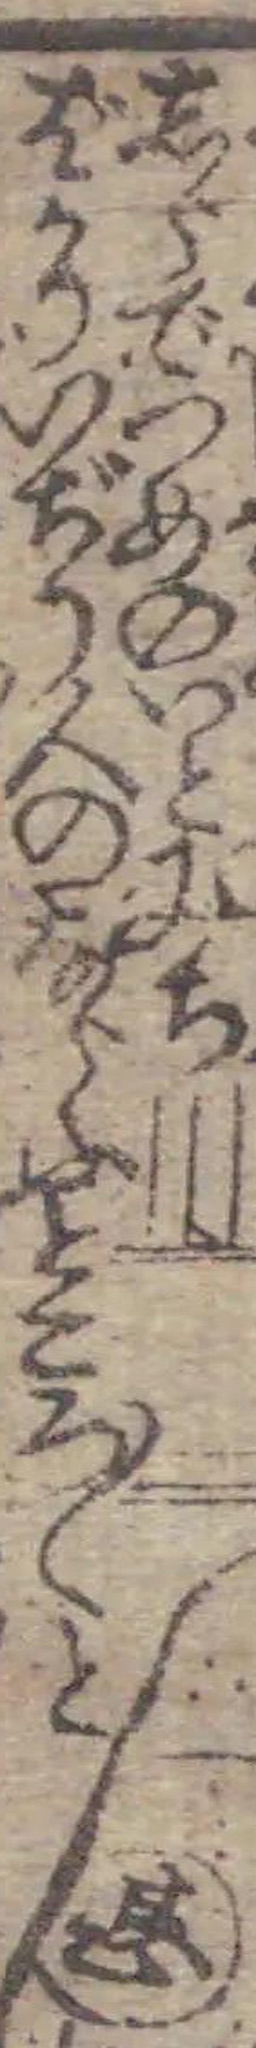ばかりいぢり人のならふところ〳〵と
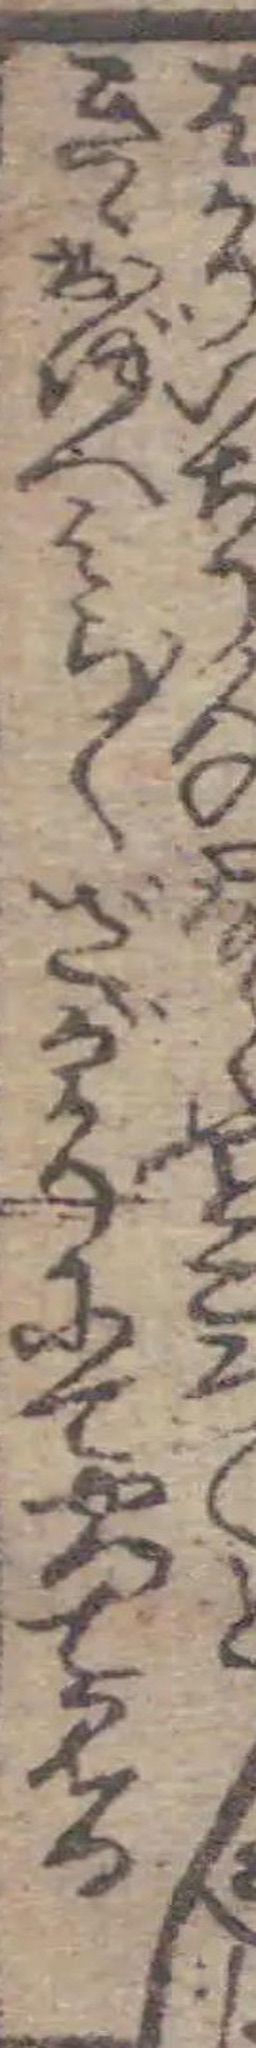きゝおぼへそら〳〵ざがけりにてやつて見る

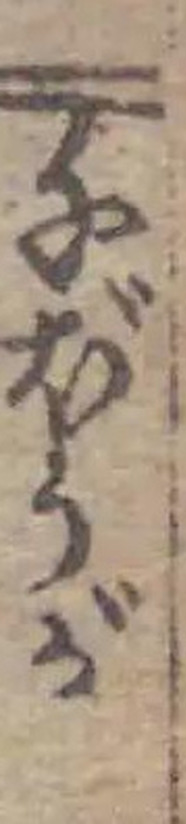千ぼうが
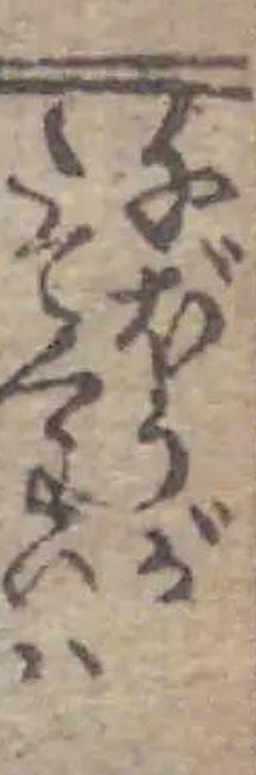たてくわいは
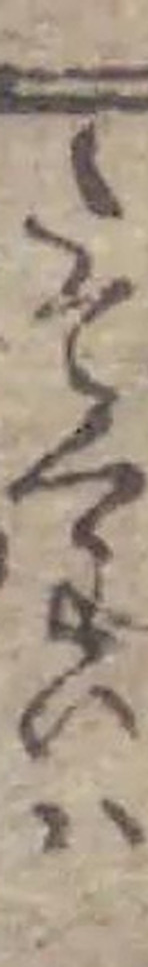たてくわいは
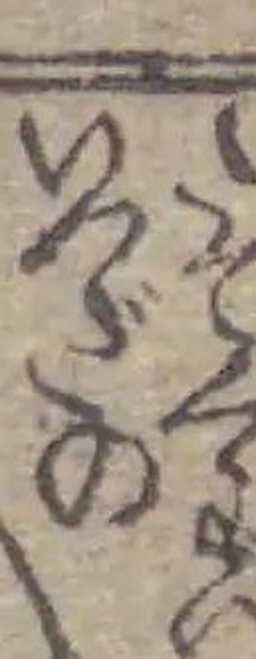いつだの
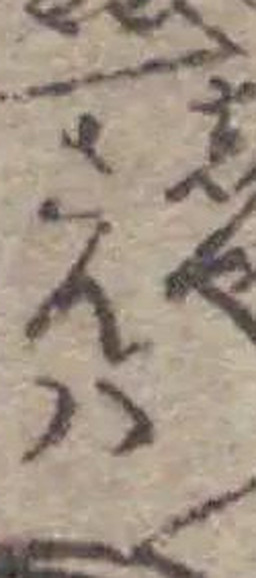さんは
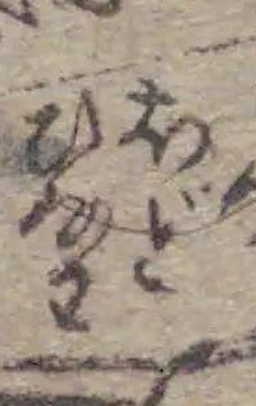ひなわ
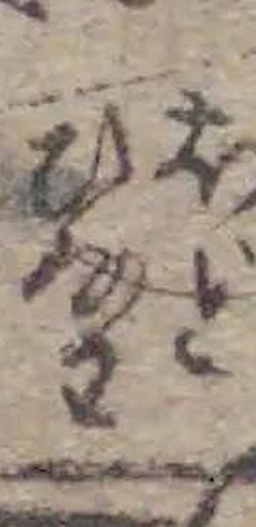ひなわ
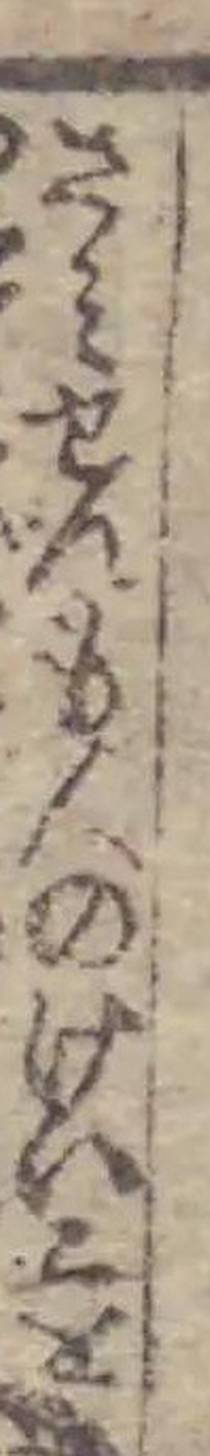さみせんも人のけいこを
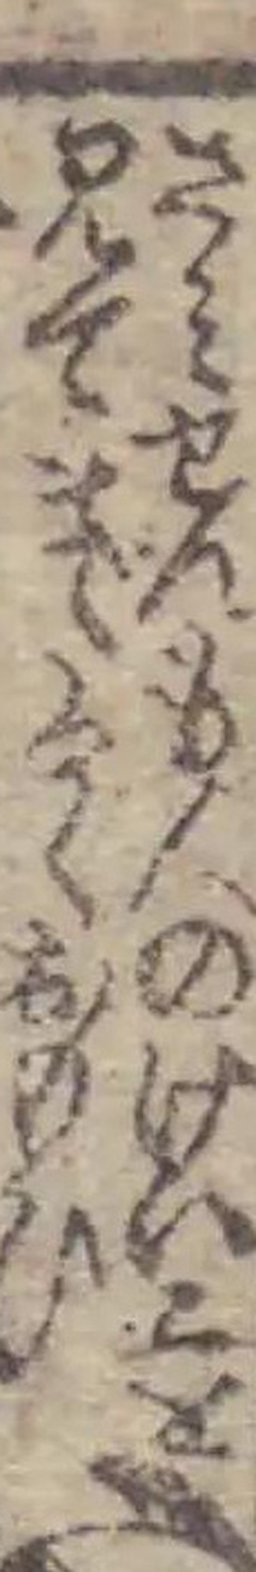見てまだるくおもひ
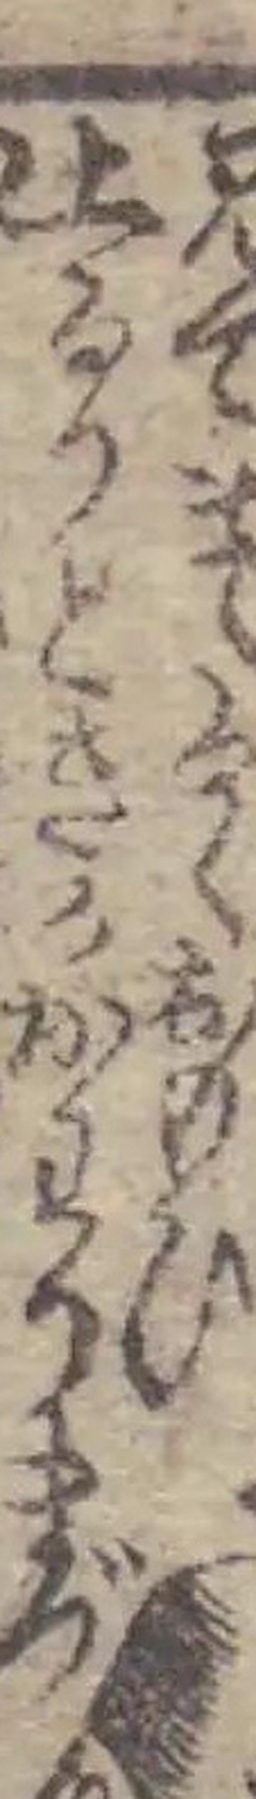上るりときかかわりまづ
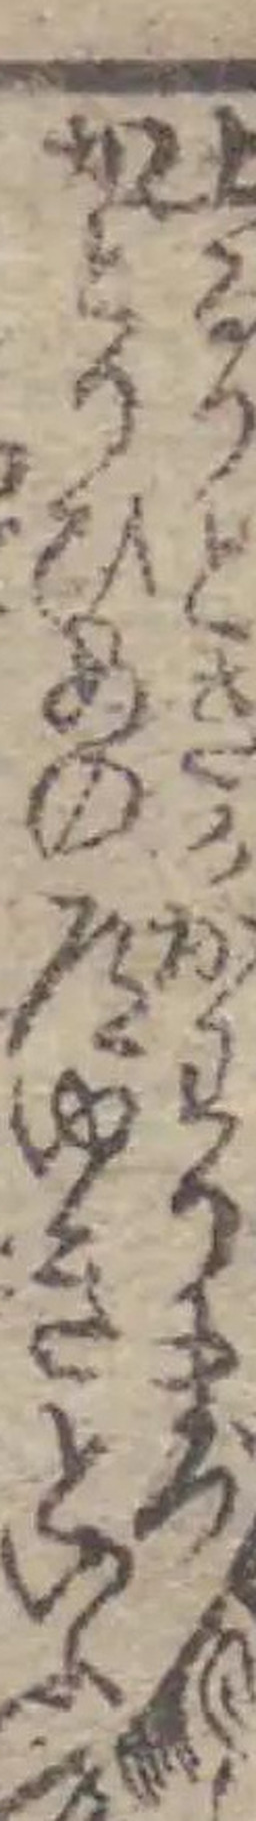かとりひめの道ゆきといふ
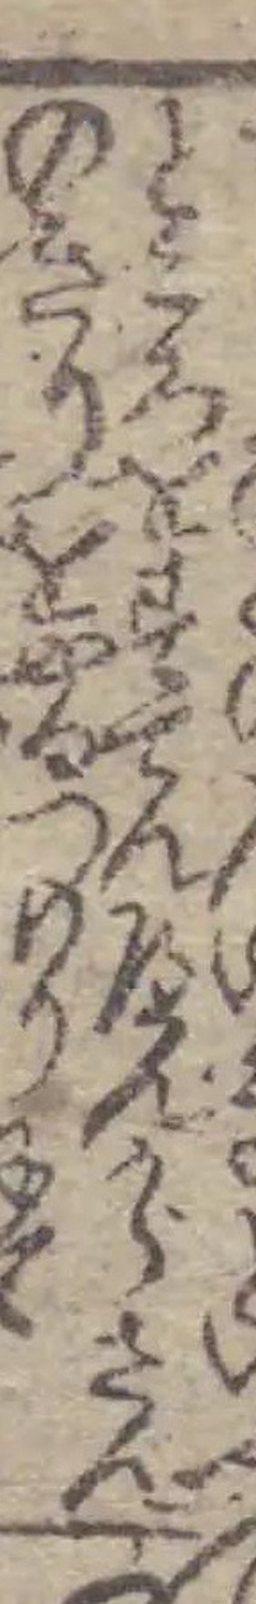のきりをやるつもりにて
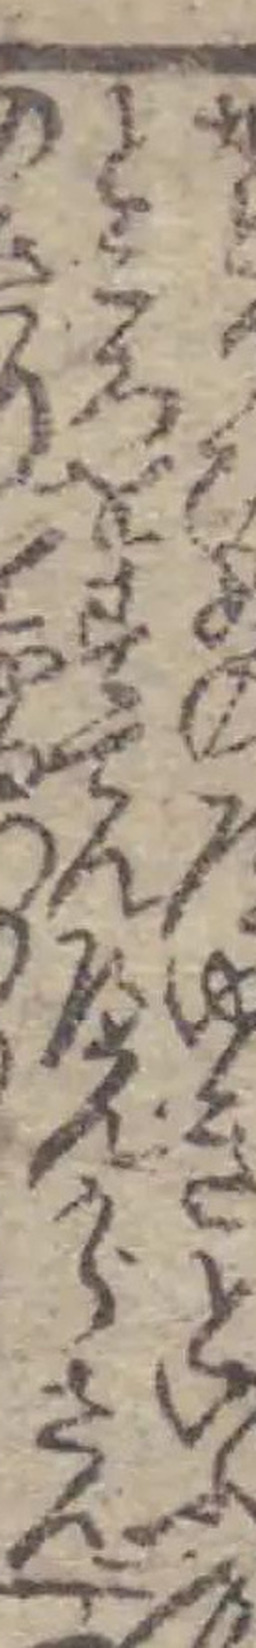ところをすてんへんからさん
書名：津以曽無弟の甚六 3巻
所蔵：国立国会図書館 National Diet Library, JAPAN
